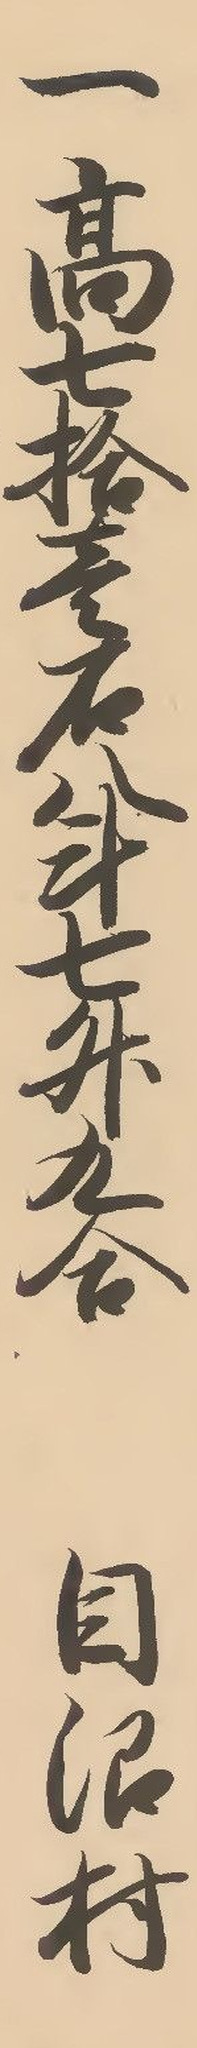一高七拾壱石八斗七升九合目沼村

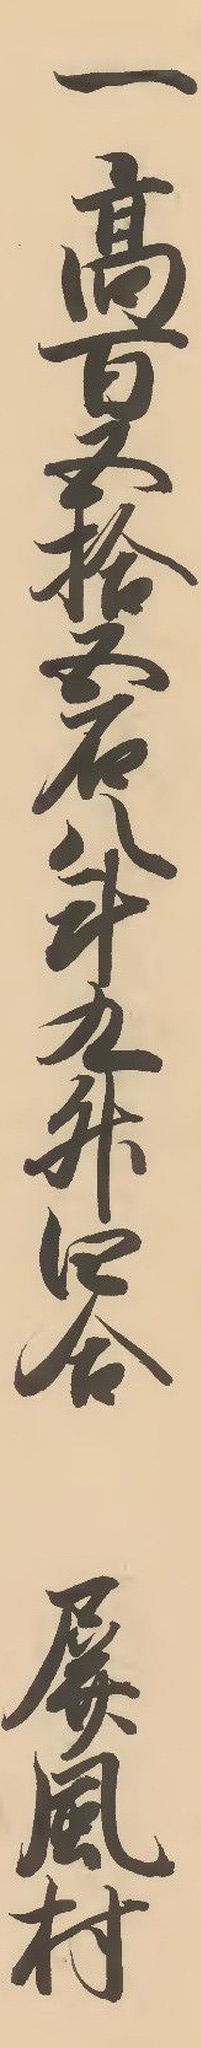一高百五拾五石八斗九升四合屏風村
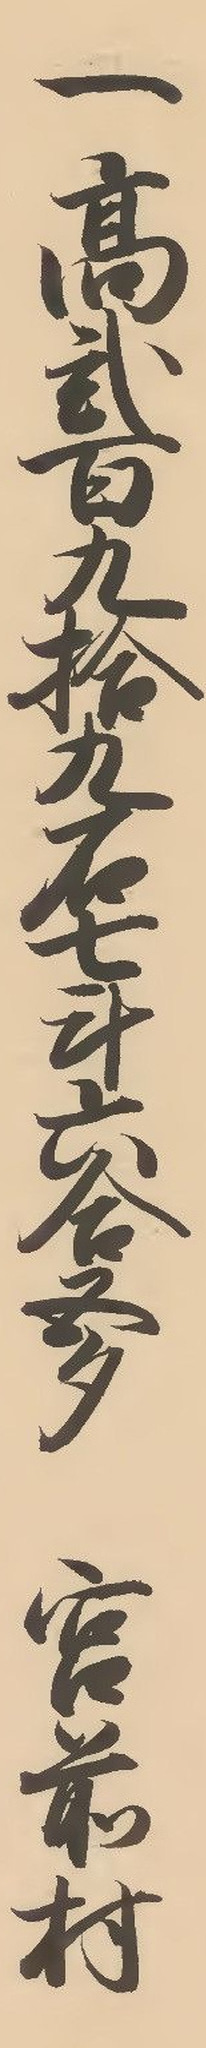一高弐百九拾九石七斗六合五勺宮前村
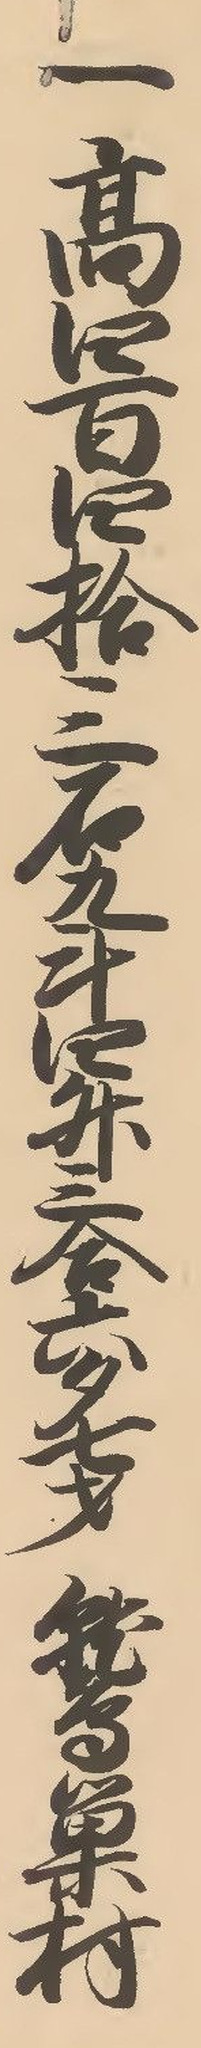一高四百四拾三石九斗四升三合六勺七才鷲巣村
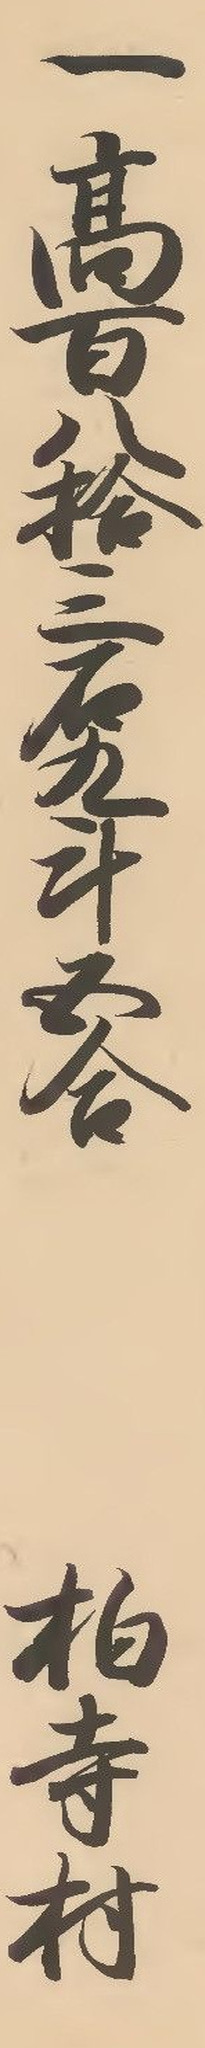一高百八拾三石九斗五合柏寺村
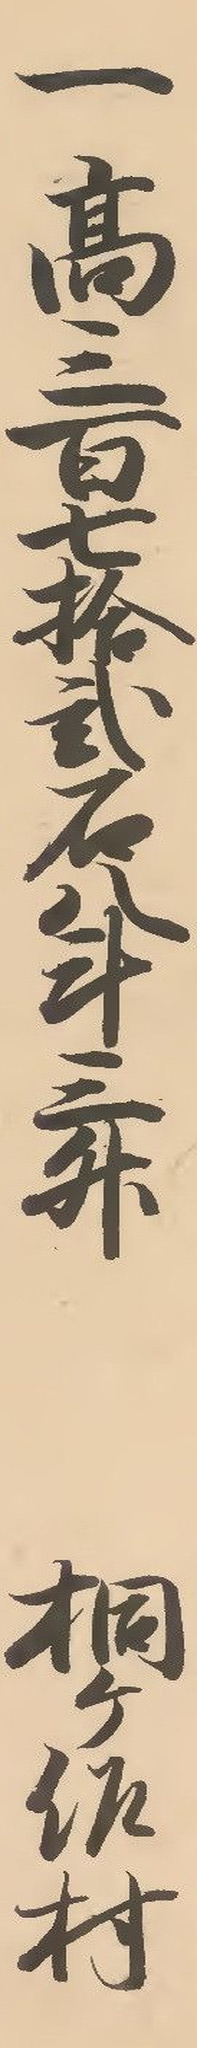一高三百七拾弐石八斗三升桐ヶ作村
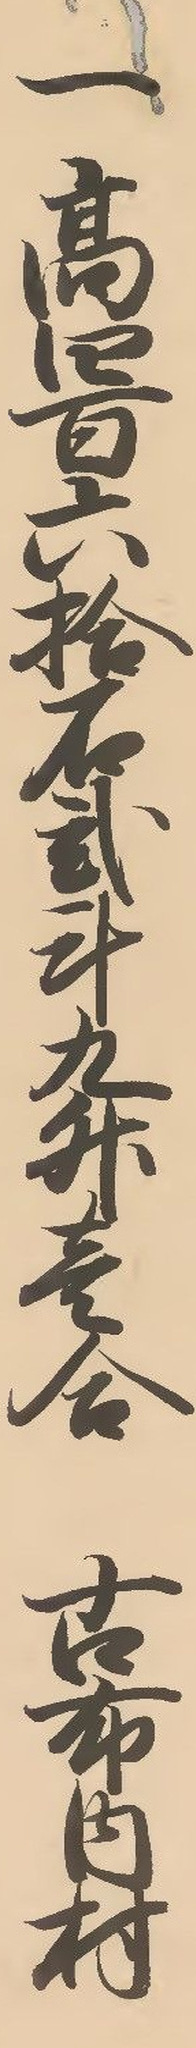一高四百六拾石弐斗九升壱合古布内村
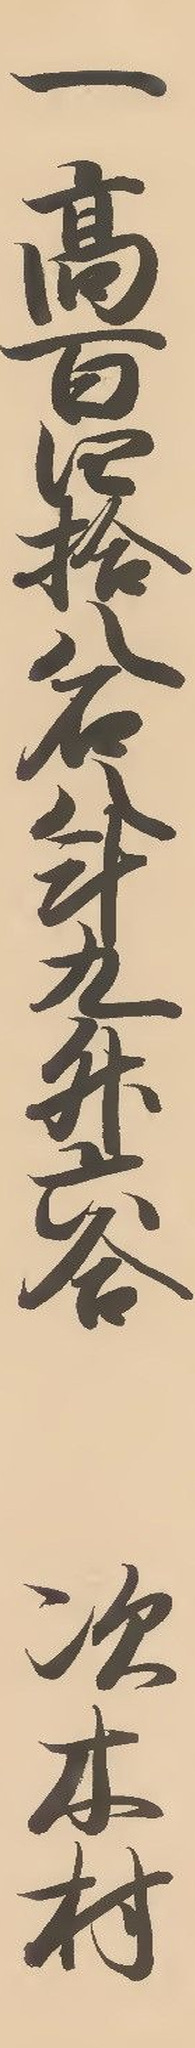一高百四拾八石八斗九升六合次木村
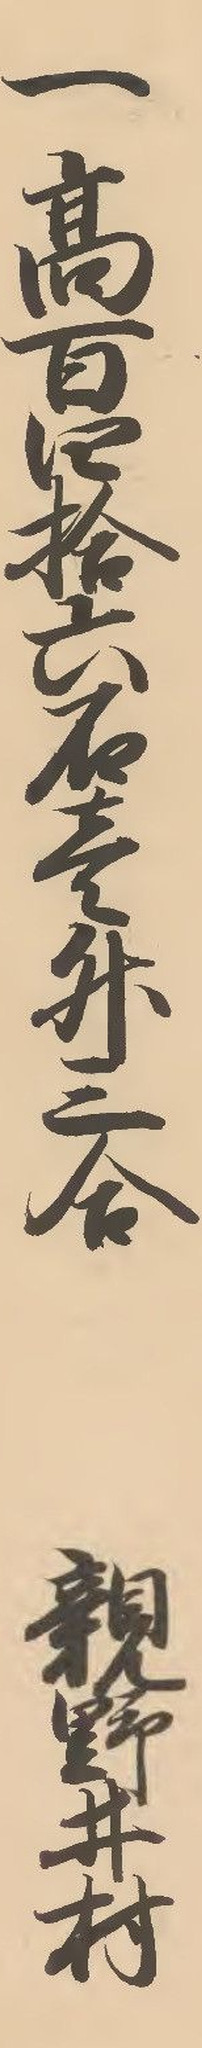一高百四拾六石壱升三合親野井村

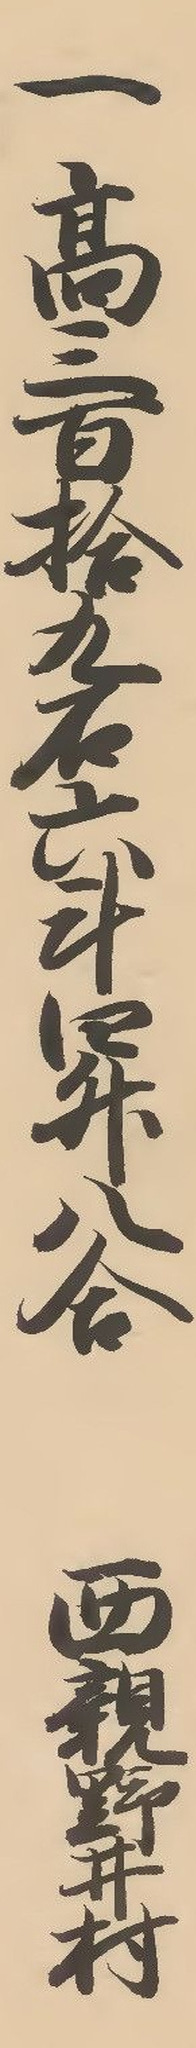一高三百拾九石六斗四升八合西親野井村
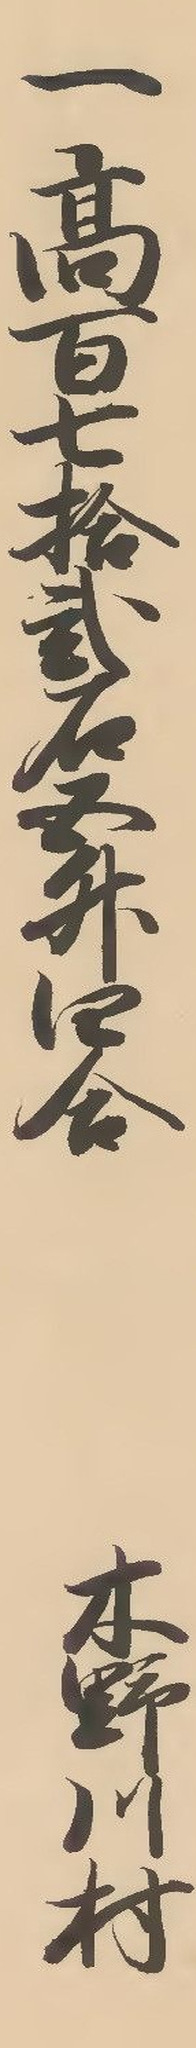一高百七拾弐石五升四合木野川村
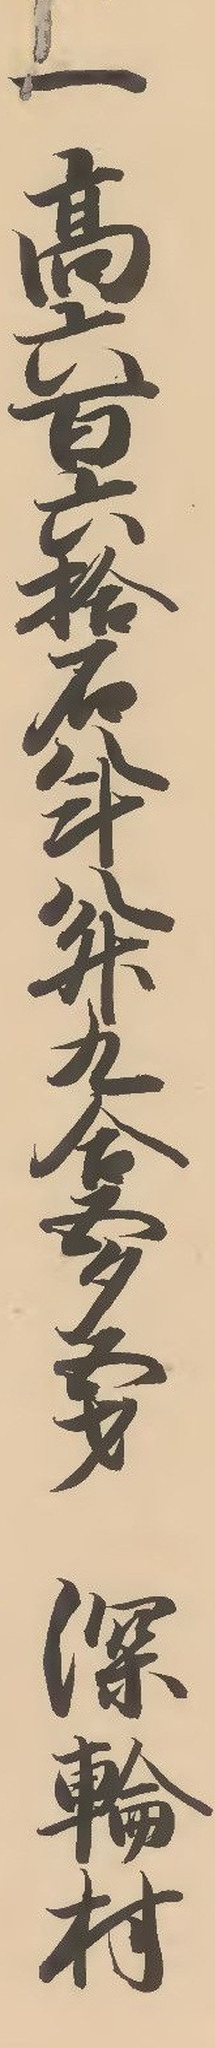一高六百六拾石八斗八升九合五勺五才深輪村
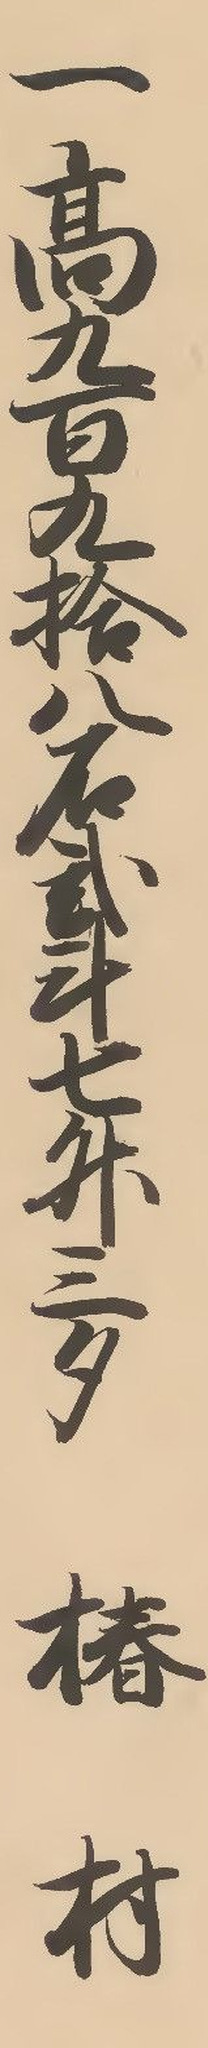一高九百九拾八石弐斗七升三勺椿村
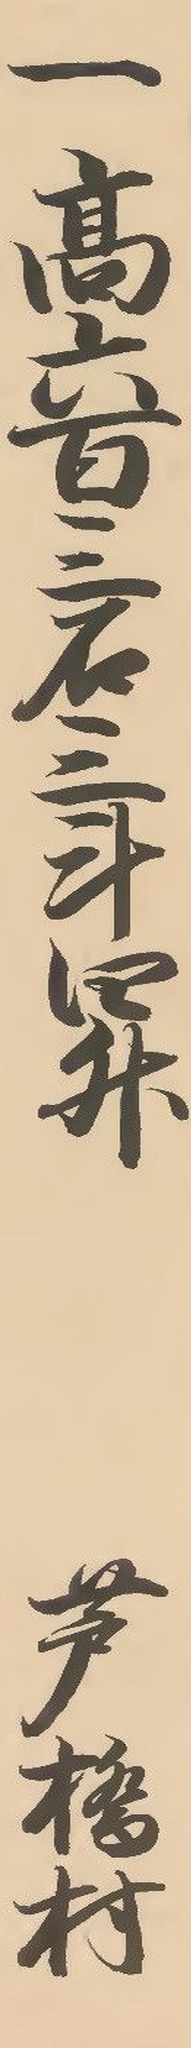一高六百三石三斗四升芦橋村
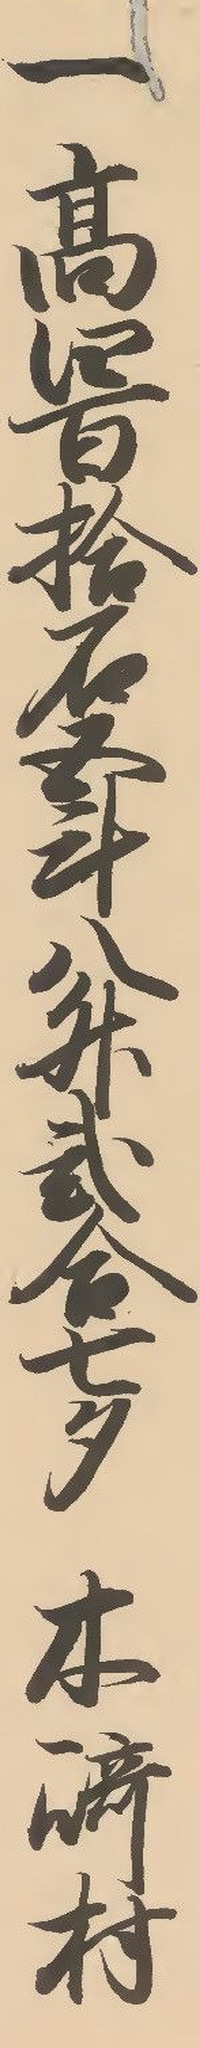一高四百拾石五斗八升弐合七勺木崎村
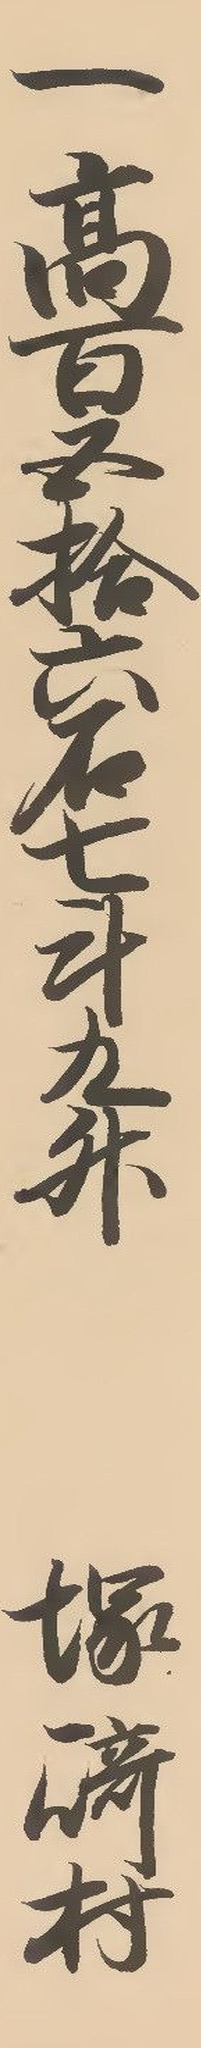一高百五拾六石七斗九升塚崎村
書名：下総国郷帳
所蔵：国立公文書館 National Archives of Japan
